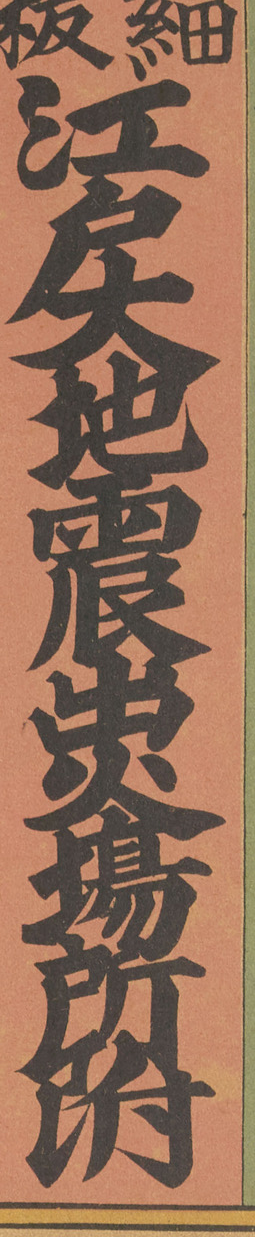銘細改板江戸大地震出火場所附
